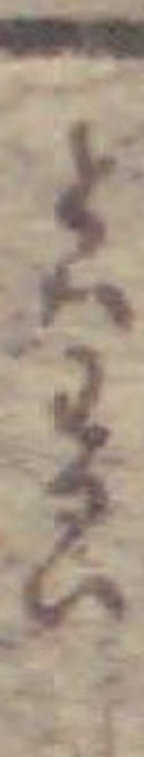とはわるい

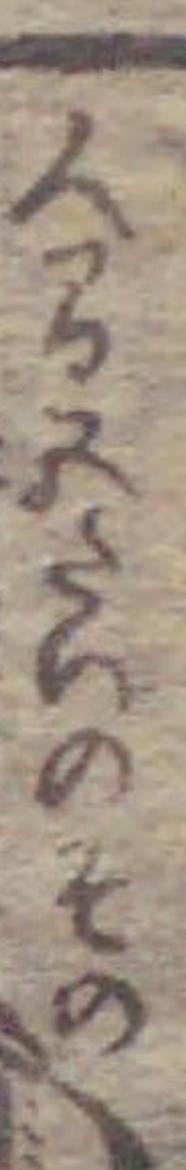人間五たいのその
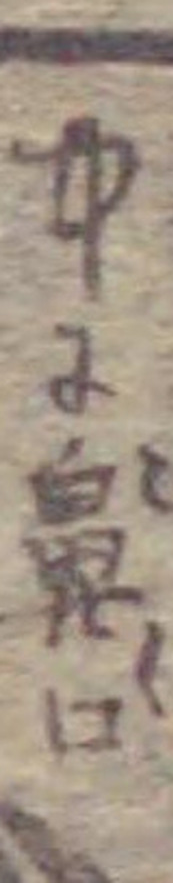中に鼻口
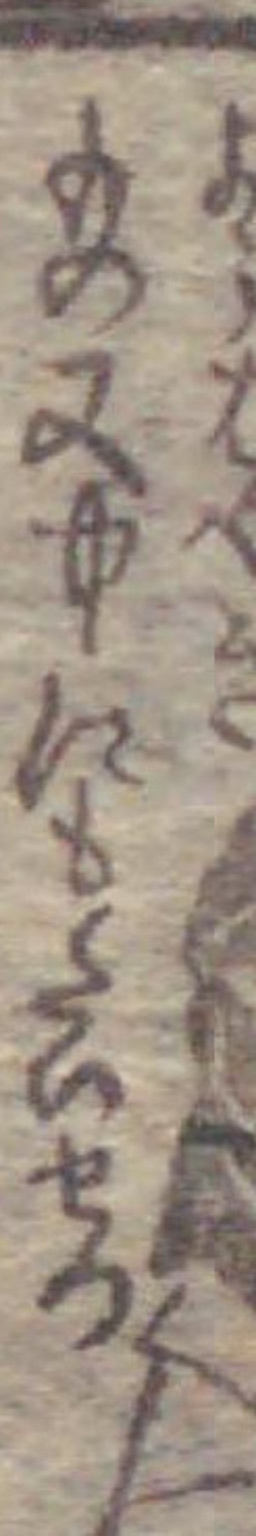もの又中にもたいせつ
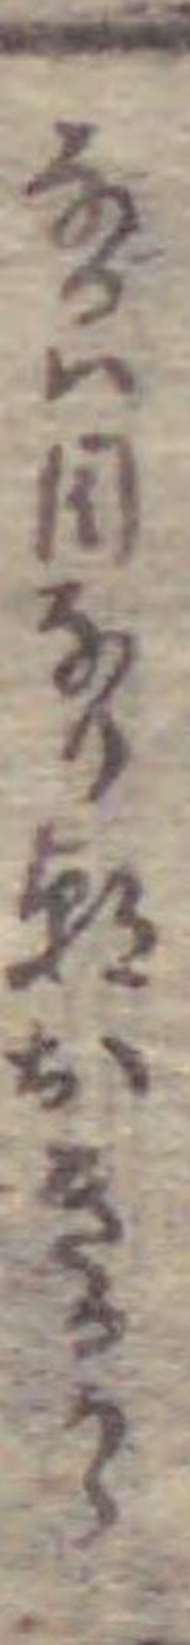なるは目なり朝おきるから
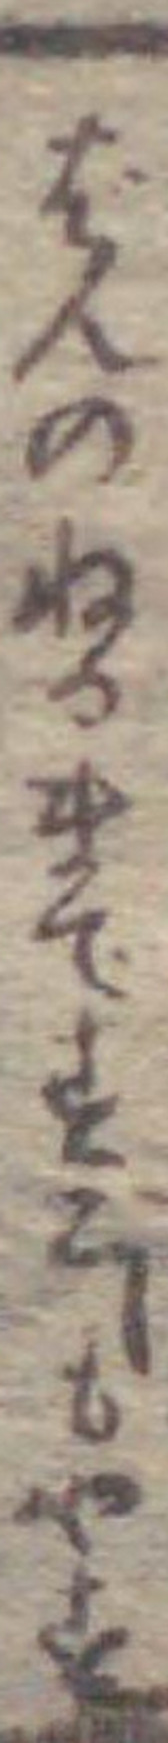ばんのねるまですこしもやす
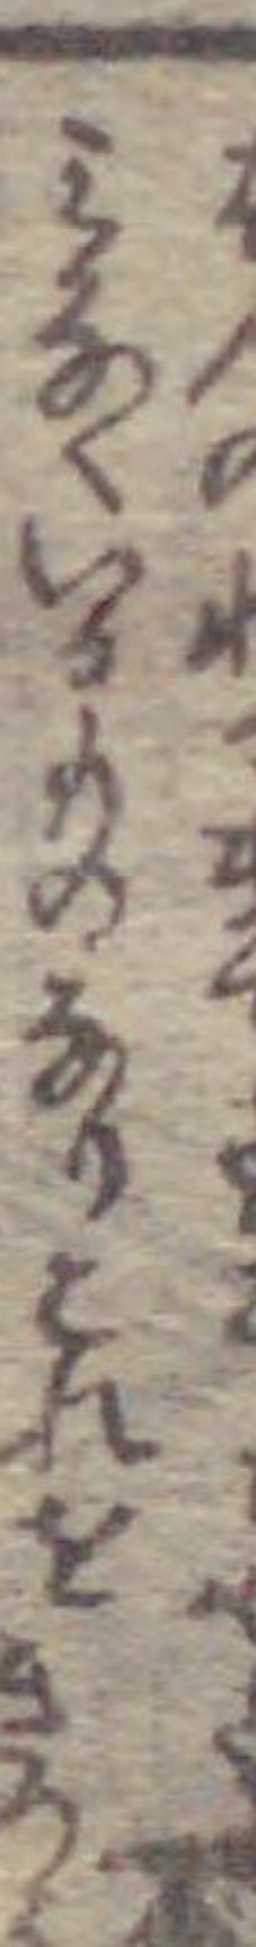みなくいるものなりこれをきつう
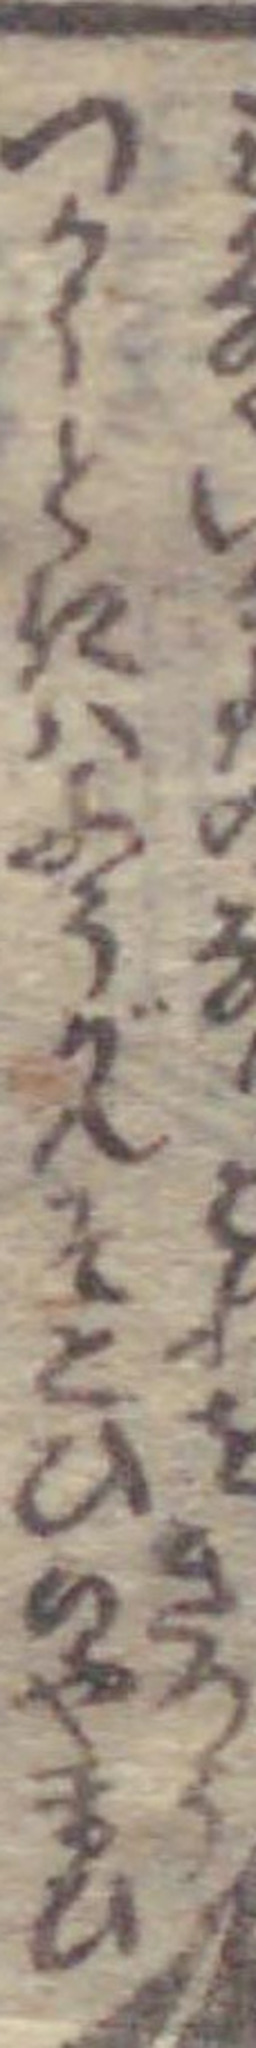つかうときはふうがんそとひのやまひ
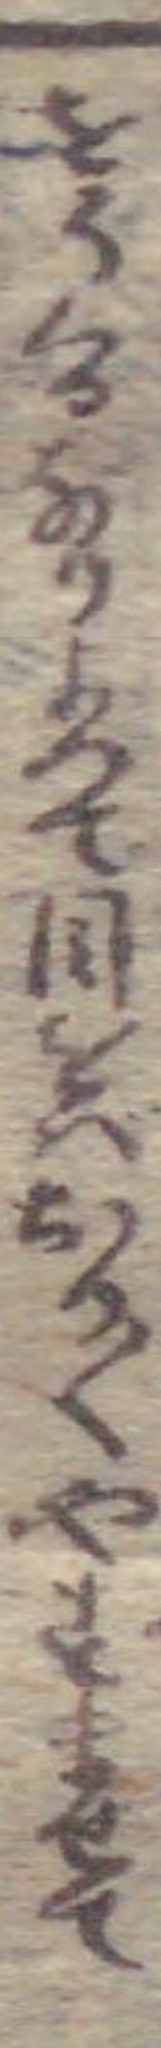をうくるなりよつて目をばおか〳〵やすませて
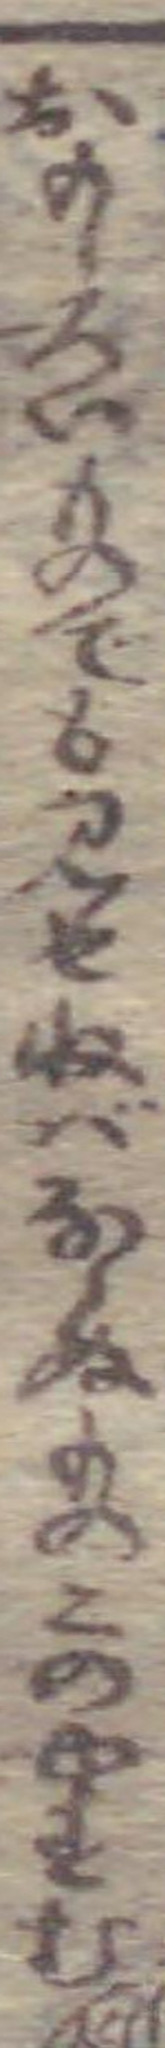おもしろいものでも見せねばならぬものこのやすむ
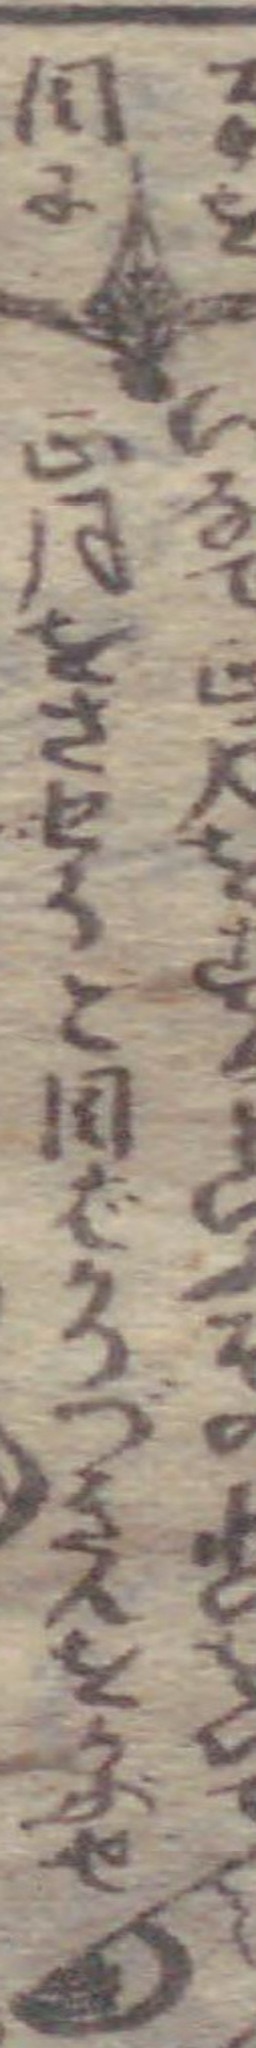目に正月をさせろと目ばかりづきんをかぶせ
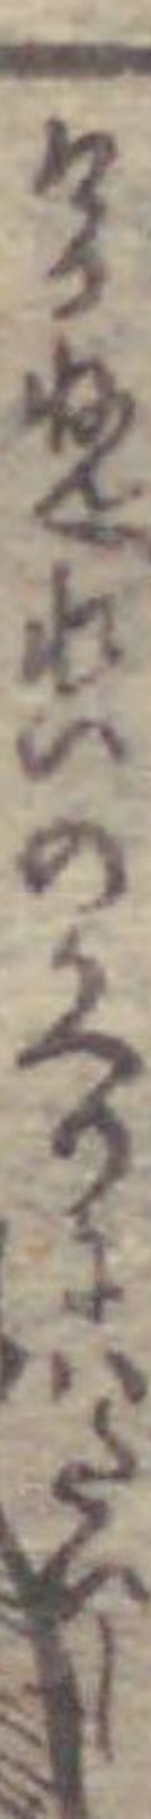けるねんれいのかへりにはだいし
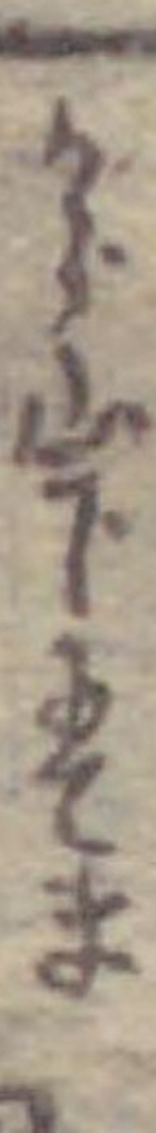から山下にてま
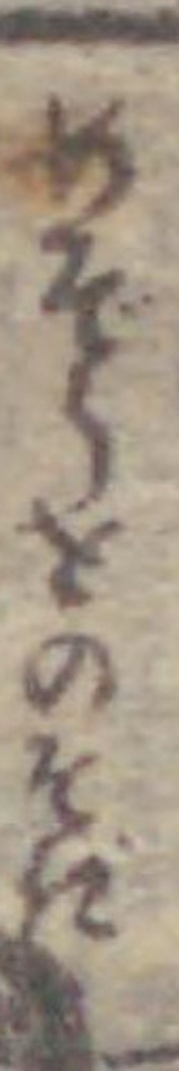めぞうをのぞき
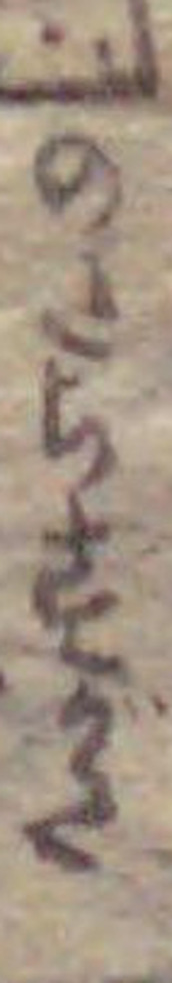のたちすがた
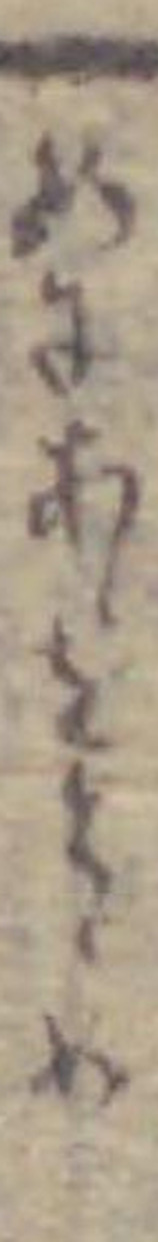めにあしをとゝめ
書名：五躰不具毒解薬 : 3巻
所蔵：国立国会図書館 National Diet Library, JAPAN
